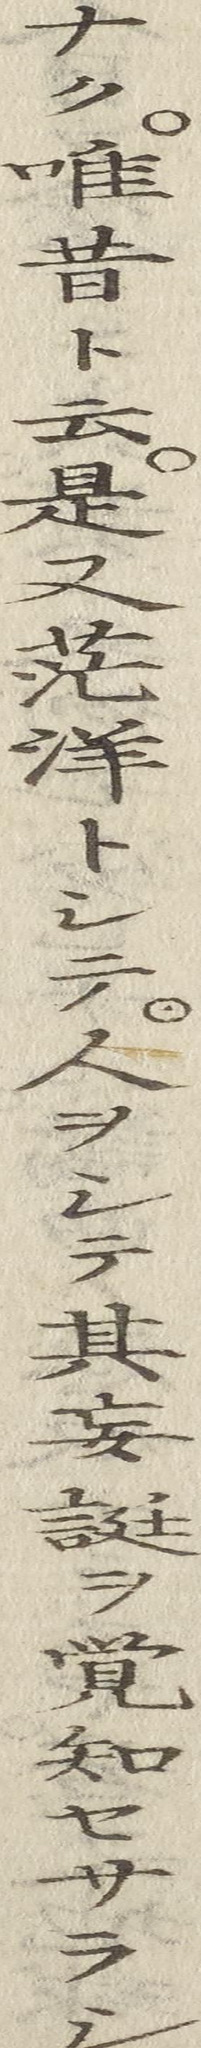ナク。唯昔ト云。是又茫洋トシテ。人ヲシテ其妄誕ヲ覚知セサラシ
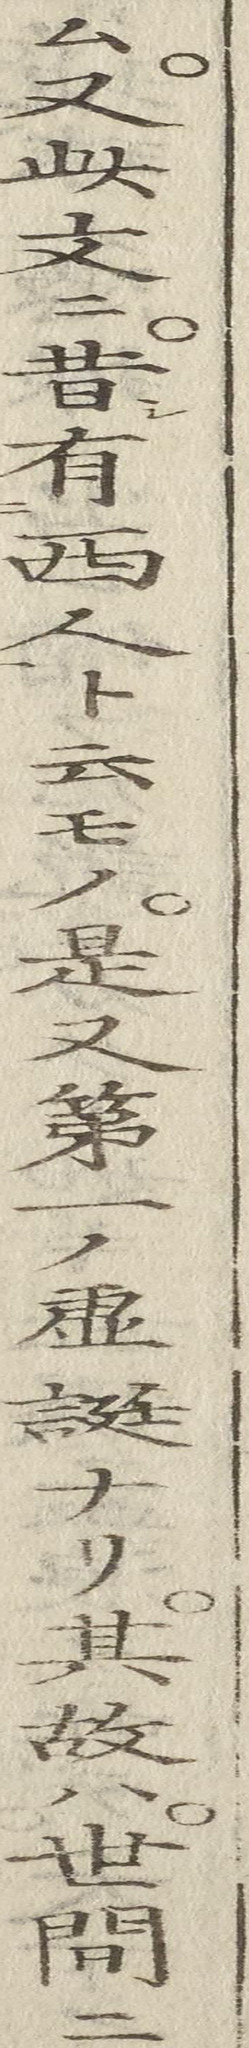ム。又此文ニ。昔有西人ト云モノ。是又第一ノ虚誕ナリ。其故ハ。世間ニ
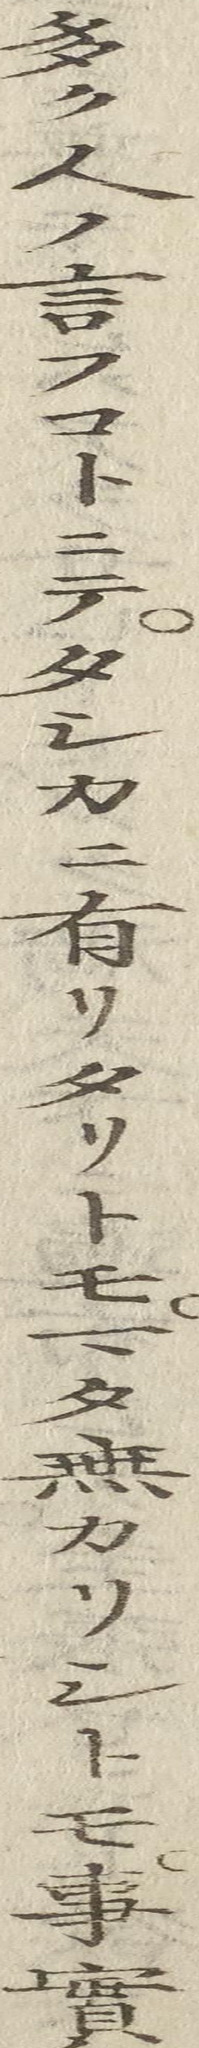多ク人ノ言フコトニテ。タシカニ有リタリトモ。マタ無カリシトモ。事実
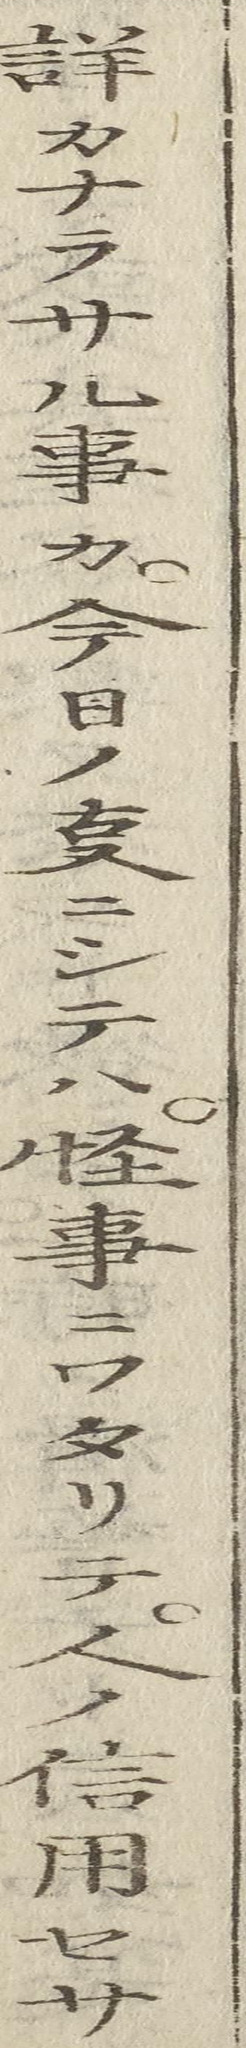詳カナサル事カ。今日ノ事ニシテハ。怪事ニワタリテ。人ノ信用セサ

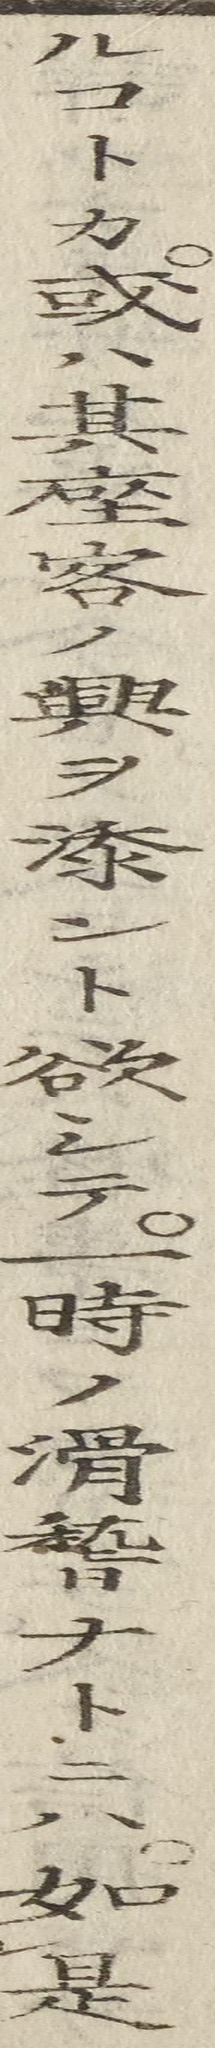ルコトカ。或ハ其座客ノ興ヲ添ント欲シテ。一時ノ滑稽ナトニハ。如是
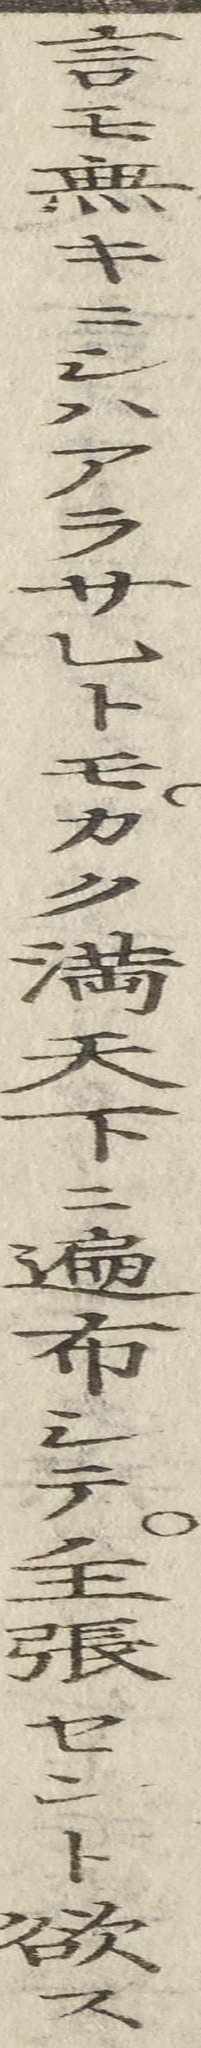言モ無キニシハアラサレトモ。カク満天下ニ遍布シテ。主張セント欲ス
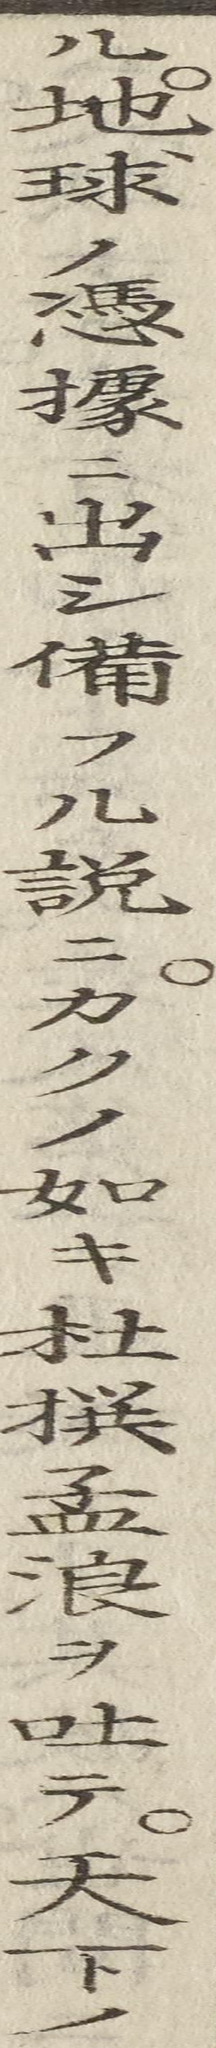ル。地球ノ憑拠ニ出シ備フル説ニ。カクノ如キ杜撰孟浪ヲ吐テ。天下ノ
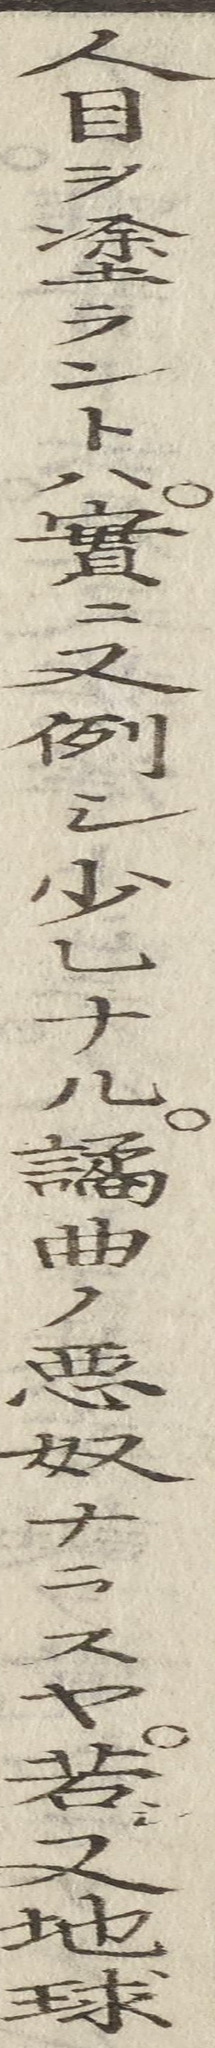人目ヲ塗ラントハ。実ニ又例シ少レナル。譎曲ノ悪奴ナラスヤ。若又地球
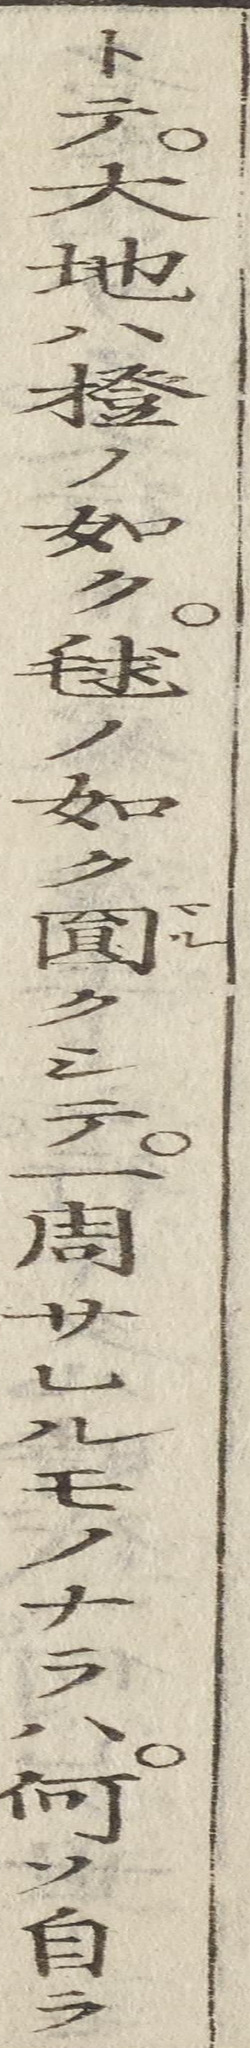トテ。大地ハ橙ノ如ク。毬ノ如ク円クシテ。一周サレルモノナラハ。何ソ自ラ
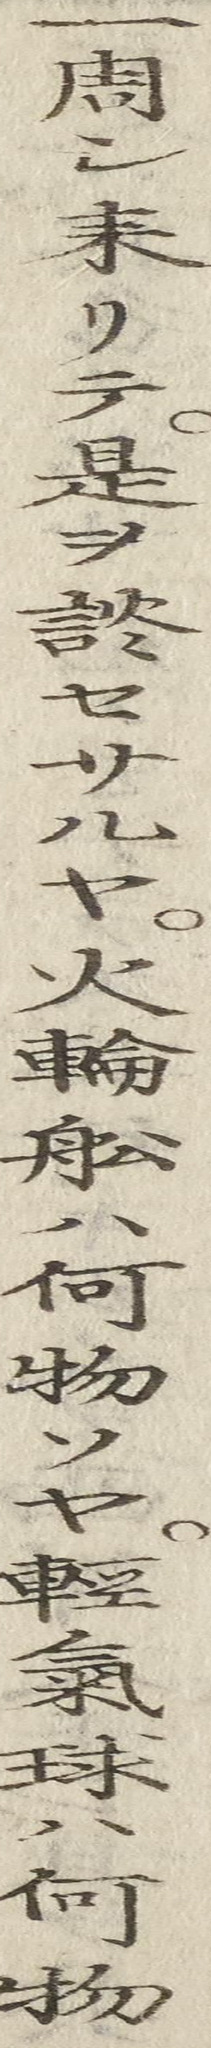一周シ来リテ。是ヲ談セサルヤ。火輪舩ハ何物ソヤ。軽気球ハ何物
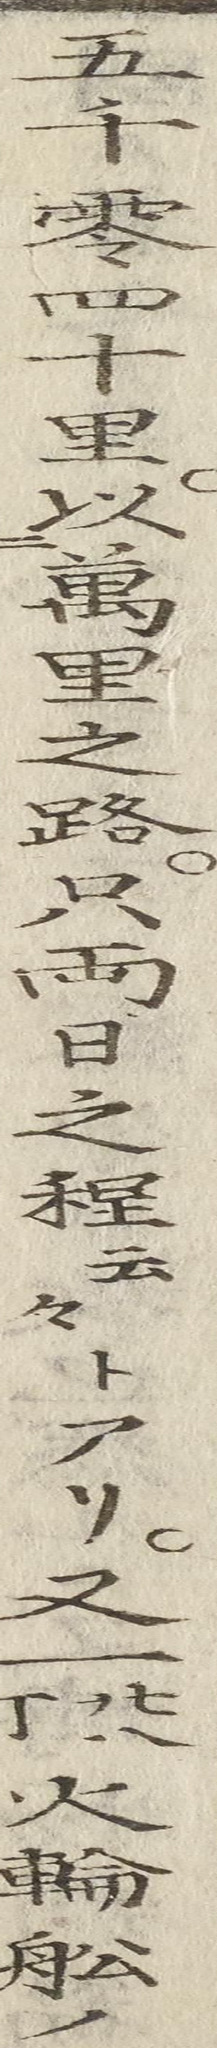五千零四十里。以万里之路。只両日之程云々トアリ。又一北八丁火輪舩ノ
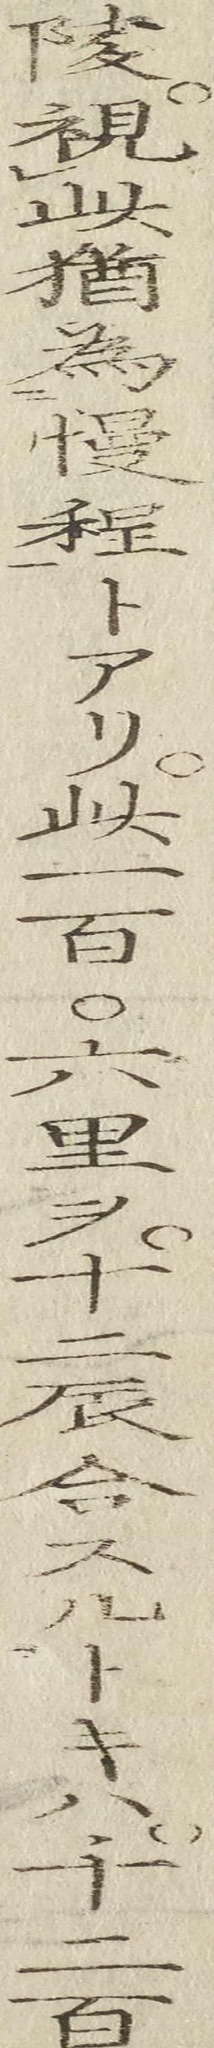陵。視此猶為慢程トアリ。此一百０六里ヲ。十二辰合スルトキハ。千二百
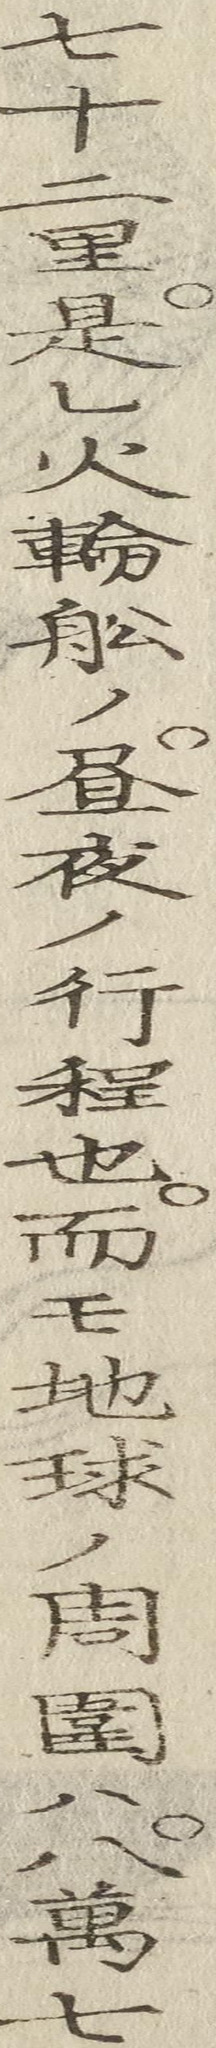七十二里。是レ火輪舩ノ。昼夜ノ行程也。而モ地球ノ周囲ハ。八万七
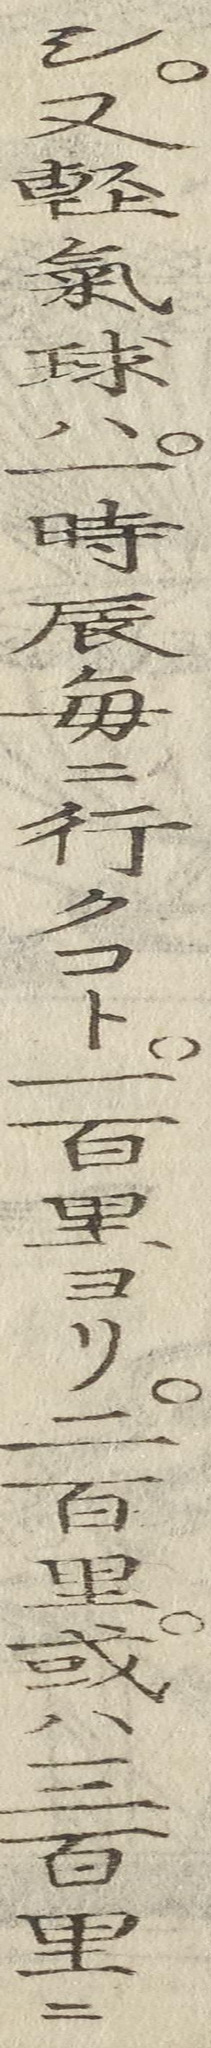シ。又軽気球ハ。一時辰毎ニ行クコト。一百里ヨリ。二百里或ハ三百里ニ
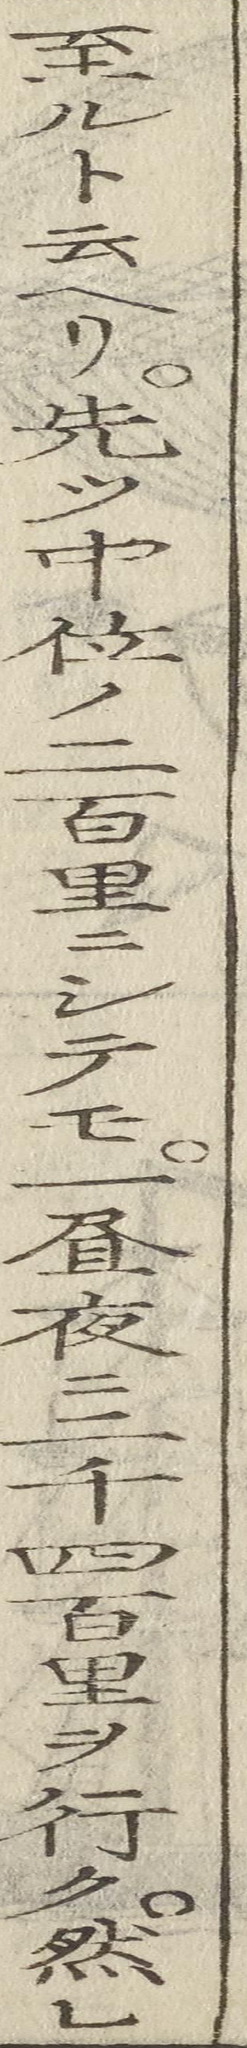至ルト云ヘリ。先ツ中位ノ二百里ニシテモ。一昼夜ニ二千四百里ヲ行ク。然レ
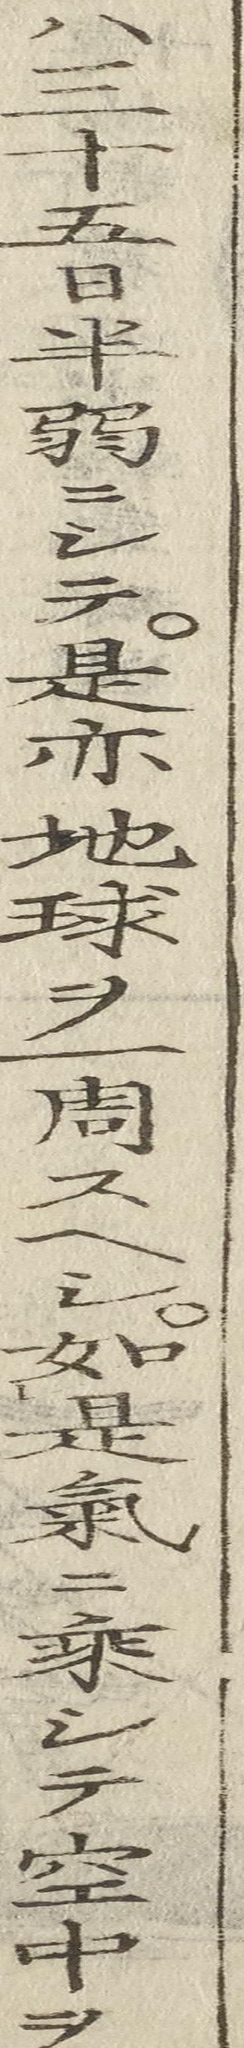ハ三十五日半弱ニシテ。是亦地球ヲ一周スヘシ。如是気ニ乗シテ空中ヲ
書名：護法新論　中
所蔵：東京大学地震研究所図書室 Earthquake Research Institute Library, The University of Tokyo, JAPAN
